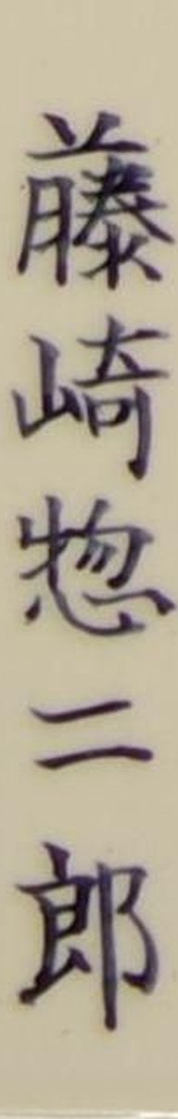藤崎惣二郎

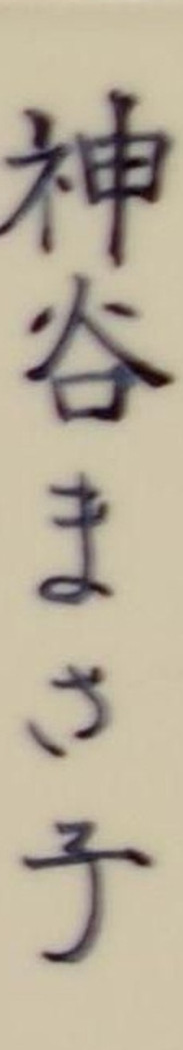神谷まさ子
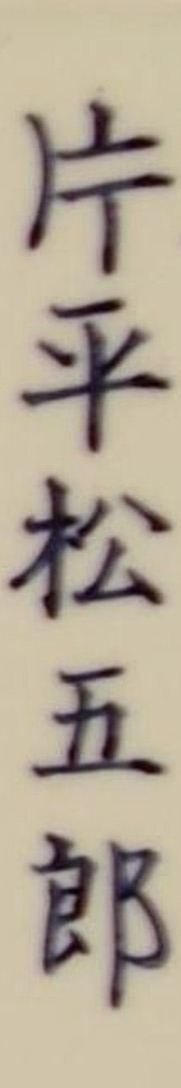片平松五郎
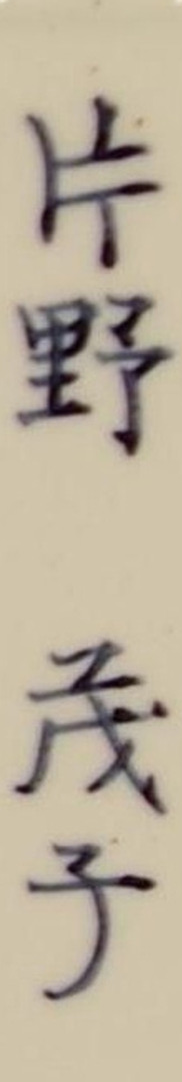片野茂子
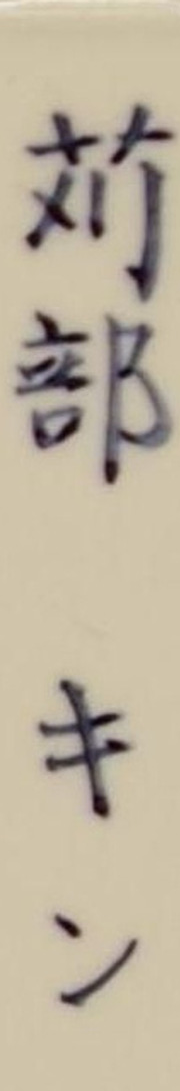苅部キン
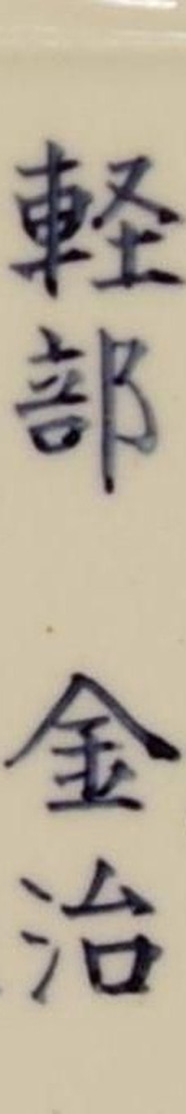軽部金治
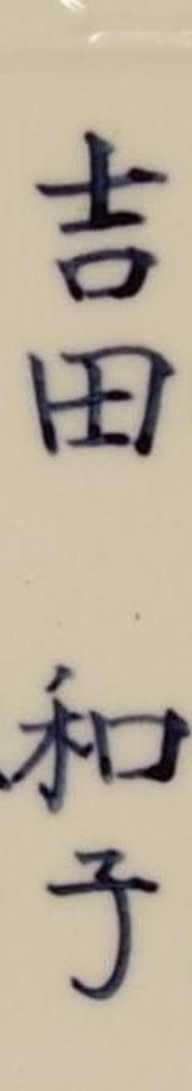吉田和子
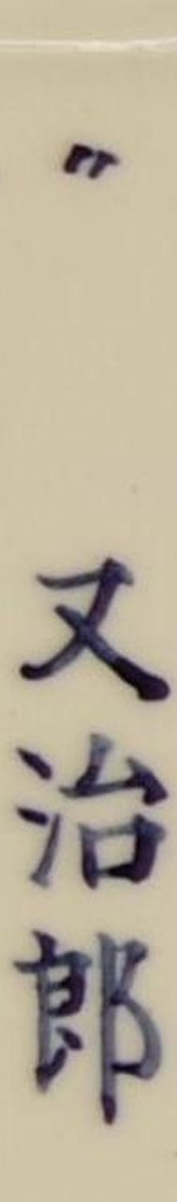又治郎
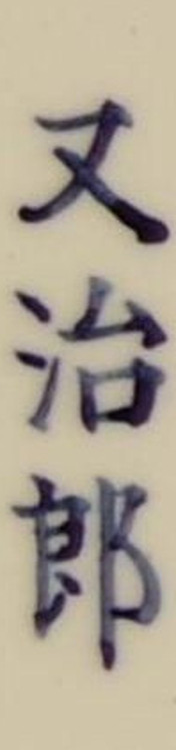又治郎
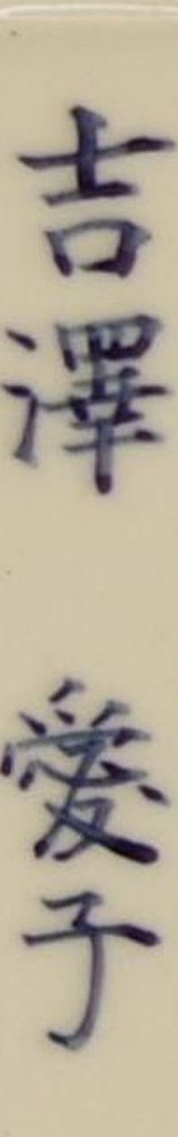吉澤愛子

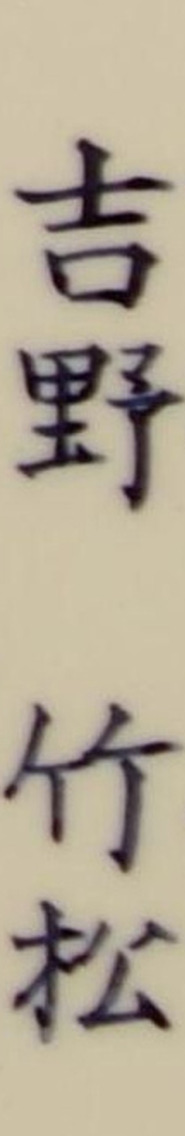吉野竹松
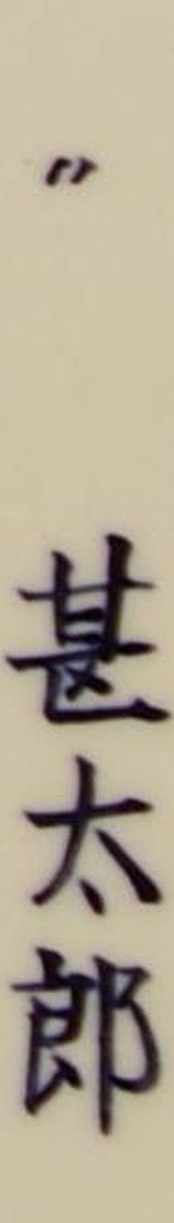甚太郎
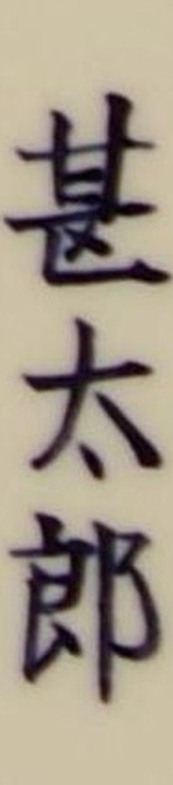甚太郎
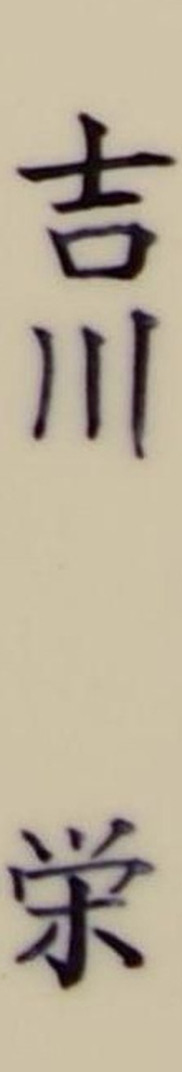吉川栄
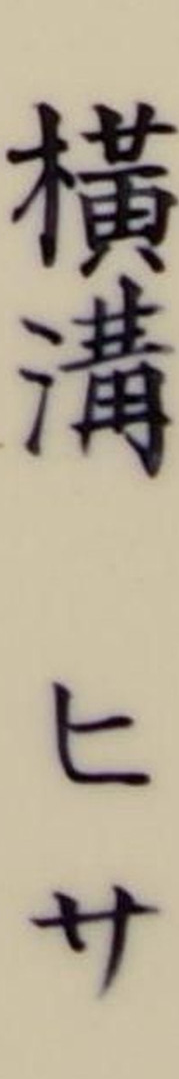横溝ヒサ
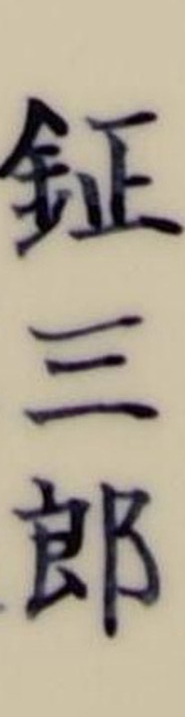鉦三郎
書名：E~L
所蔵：高野山金剛峯寺
